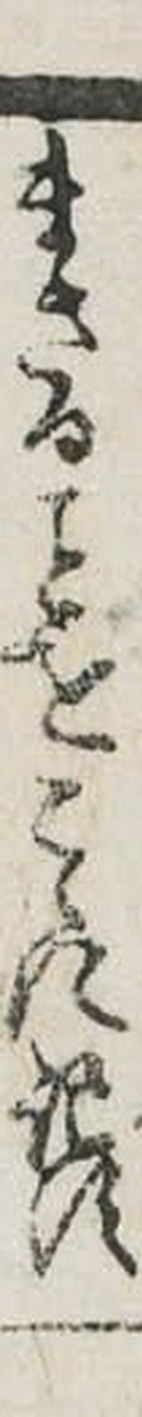まさることをこゝに記す
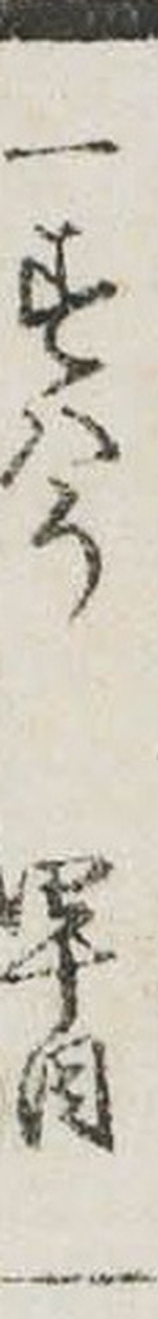一すはう四十目
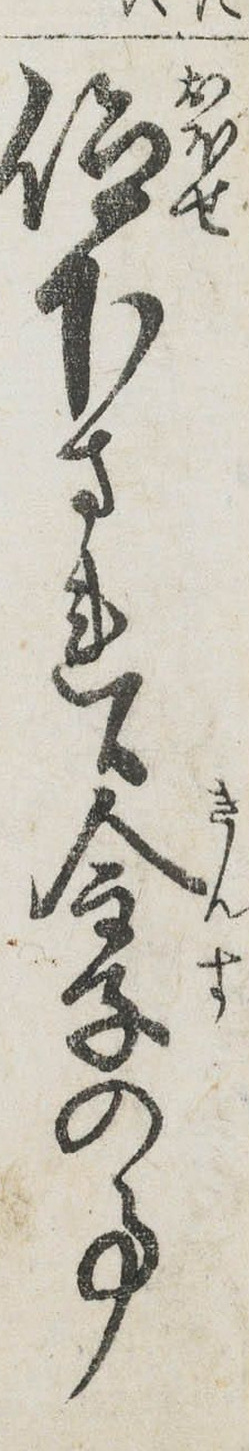仰下され候金子の事
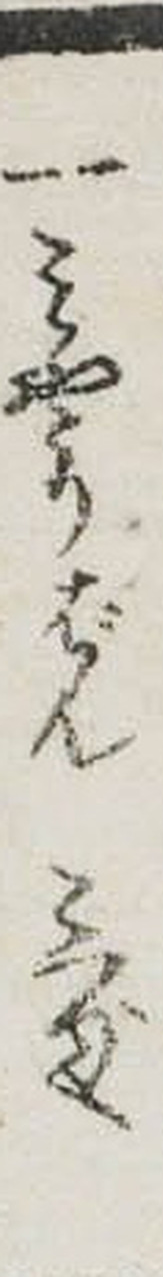一みやうばん三匁
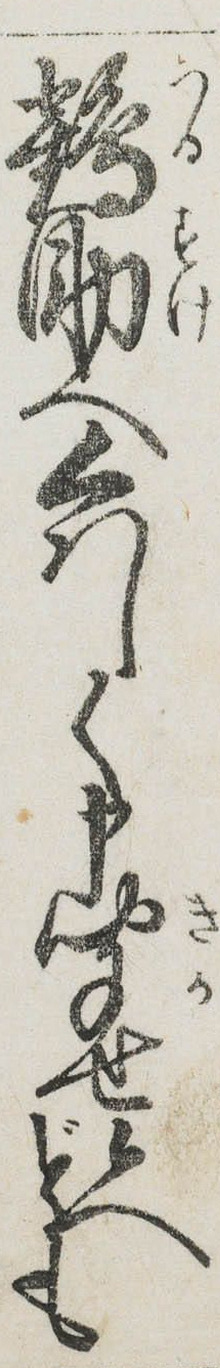鶴助へくはしく申聞せ候へども
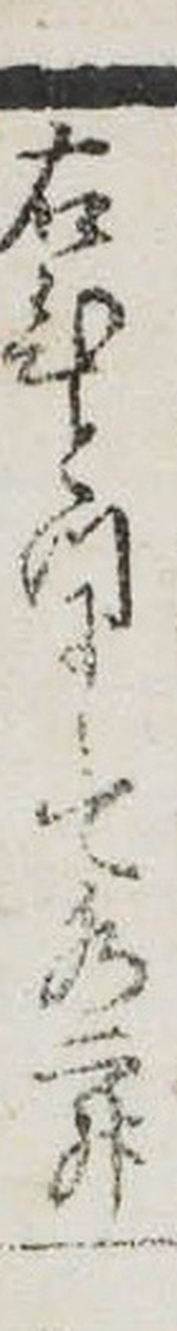右ひとつにして水二升
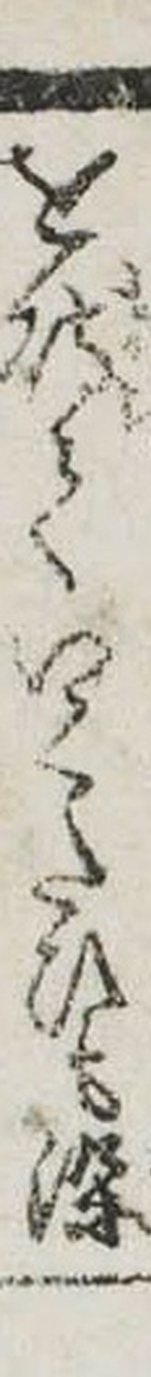を待ていくたひも染
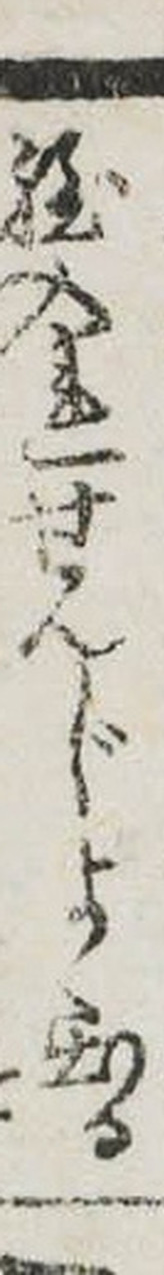程入れせんじよく出る
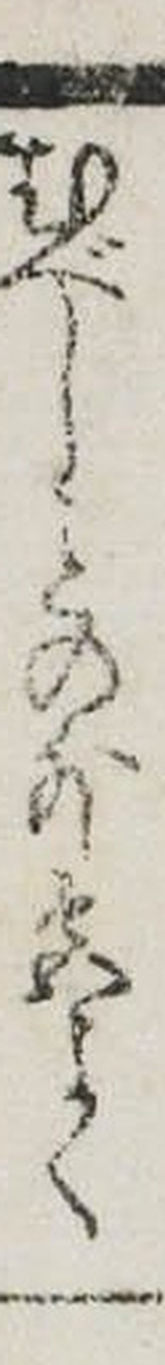むべしことの外色よく
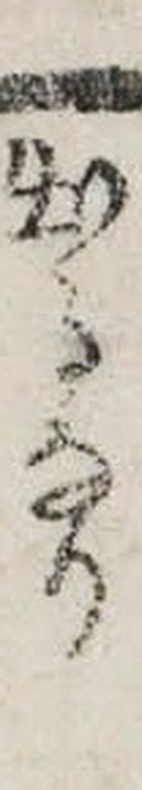出るなり
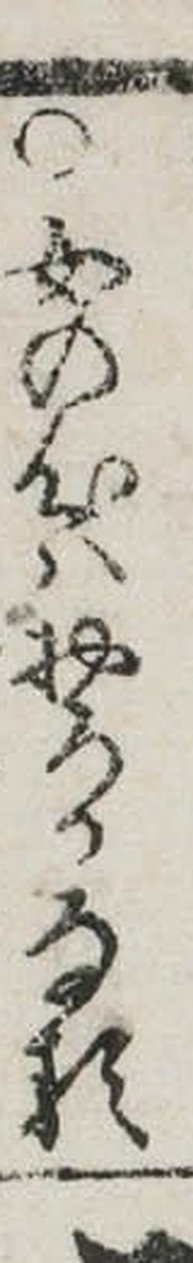○女の心はおろかなる
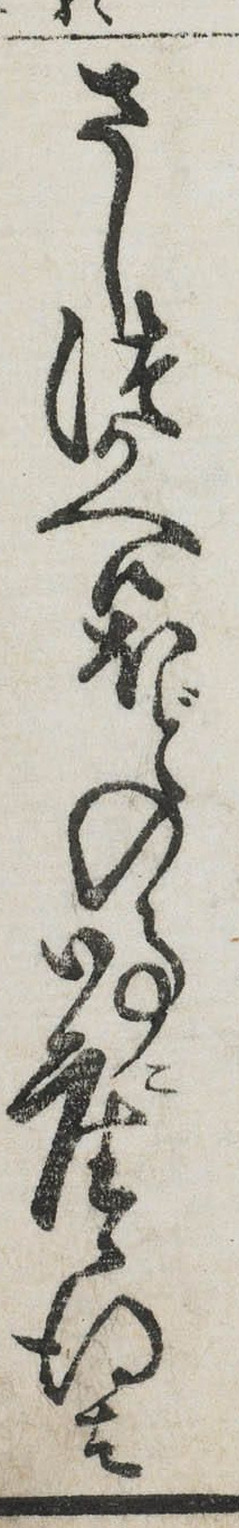さしつかへ候ほどの事に御座候得は
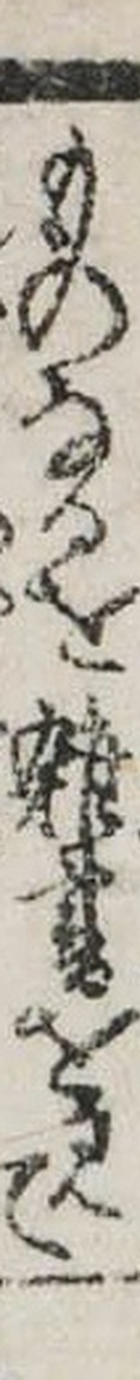ものなるを雑書を見て
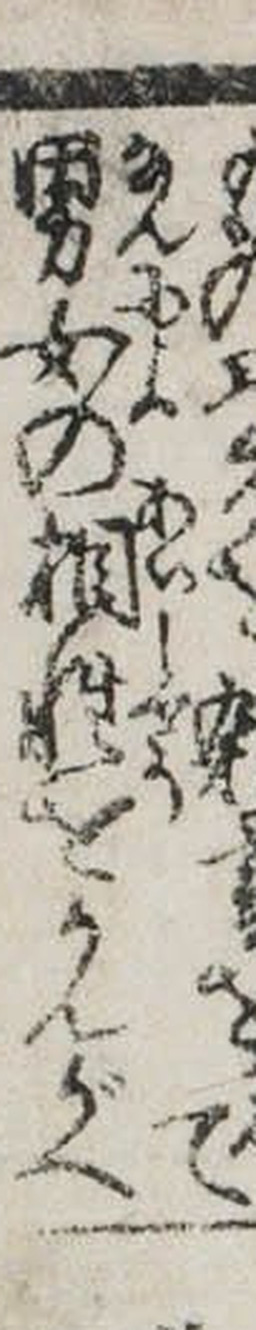男女の相性をかんがへ
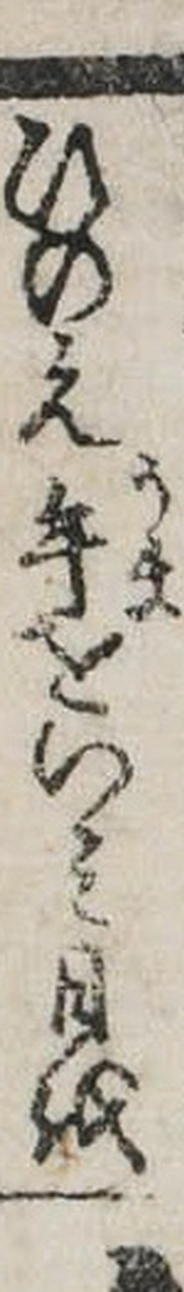ひのえ午をいみ日を
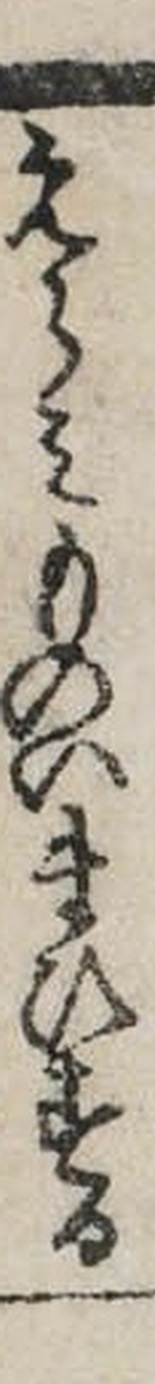うらみものいまひする
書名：頭書萬用婦人手紙之文言
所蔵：東京学芸大学教育コンテンツアーカイブ
